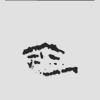金
